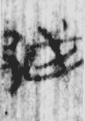○（越）
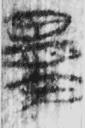異
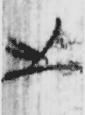之
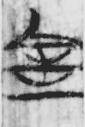金
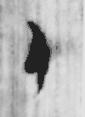十
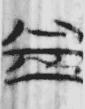益
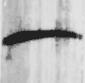一
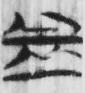益
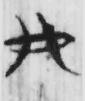四
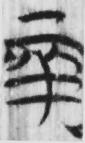兩
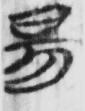昜（陽）
